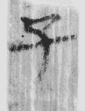子
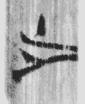之
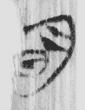明
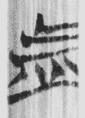者
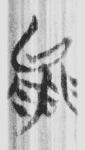能
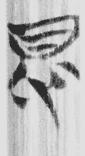𠭁
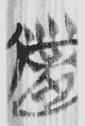{人菐臣}
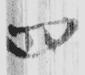四
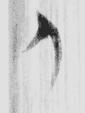人
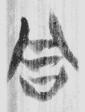同
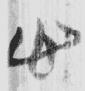心
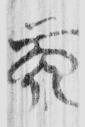而
